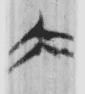大
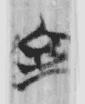室
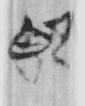即
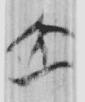立
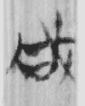咸
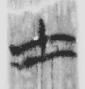士
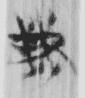疌
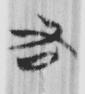右
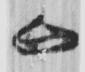白
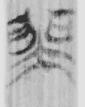{聑大}
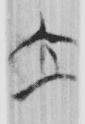立
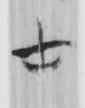才
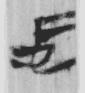𠁩
